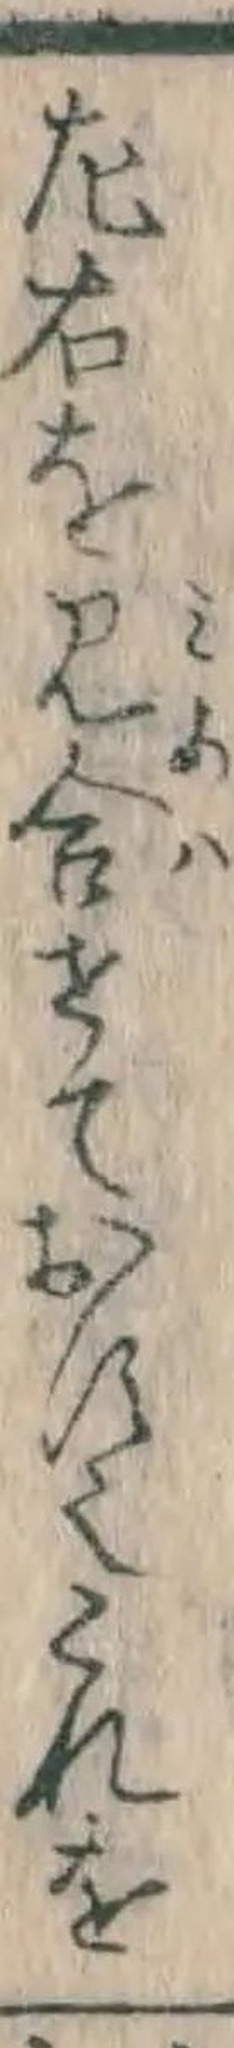左右を見合せておす也これを
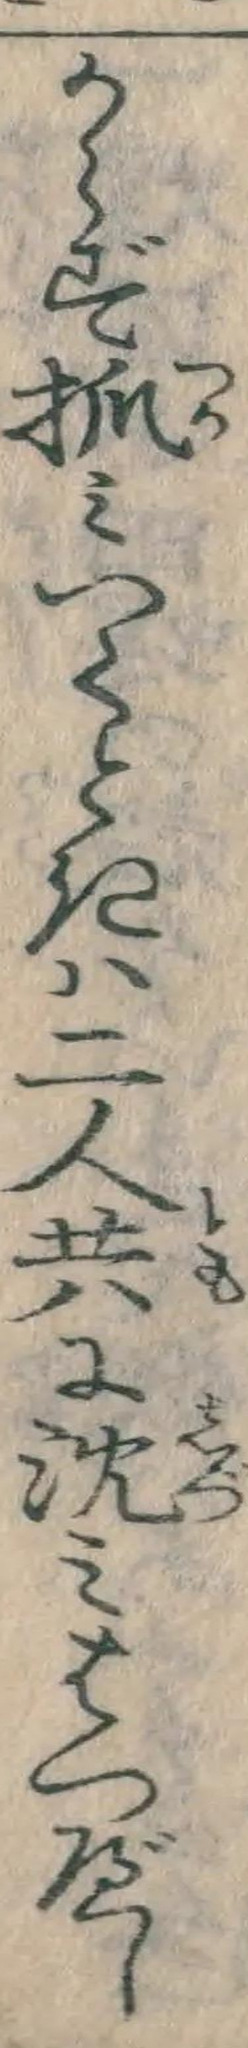からず抓みいくときは二人共に沈みはつべし
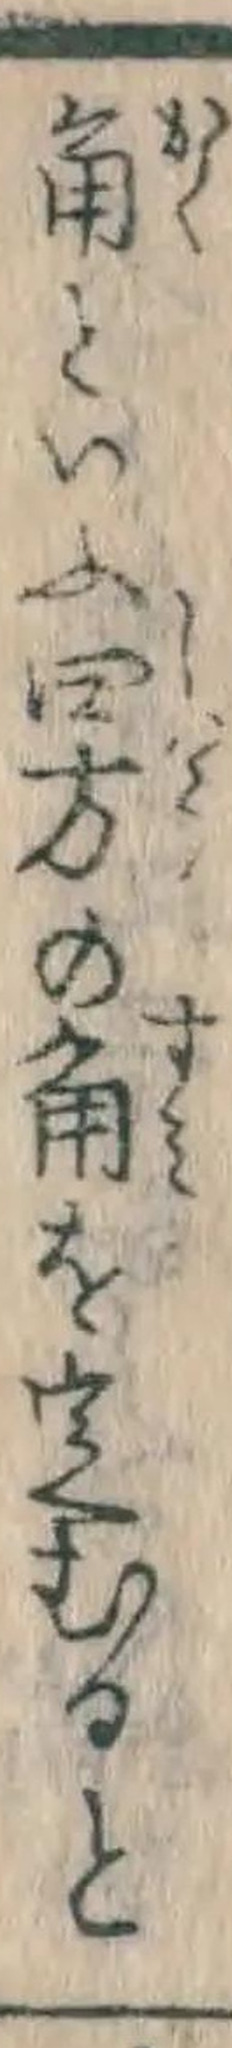角といふ四方の角を定むると
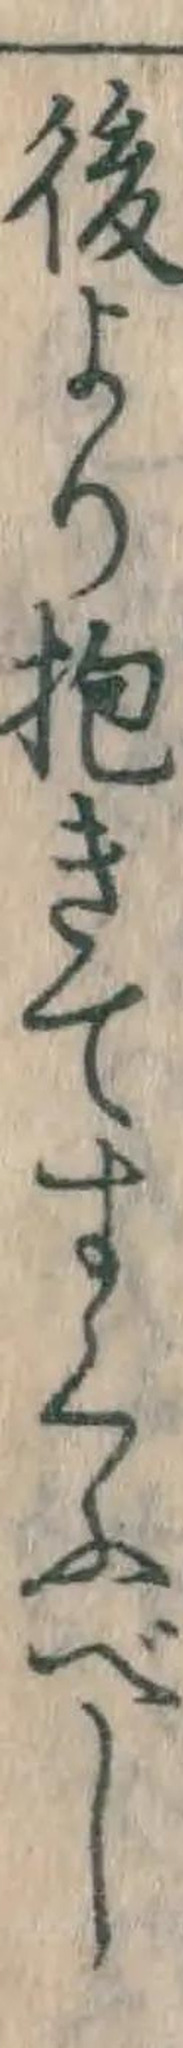後より抱きてすくふべし

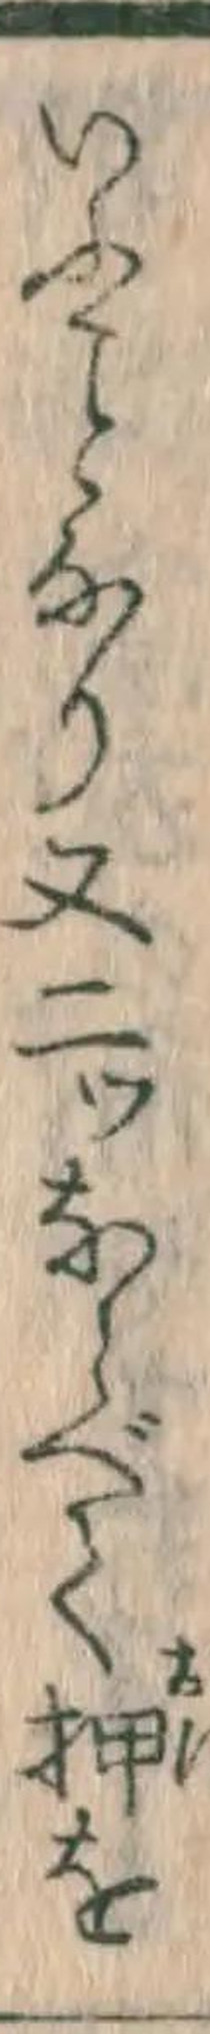いふことなり又二ッならべて押を
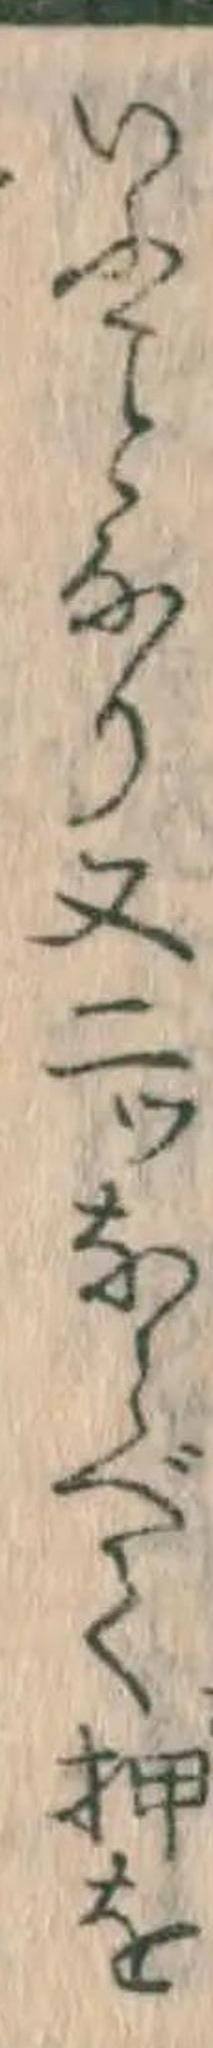いふことなり又二ッならべて押を
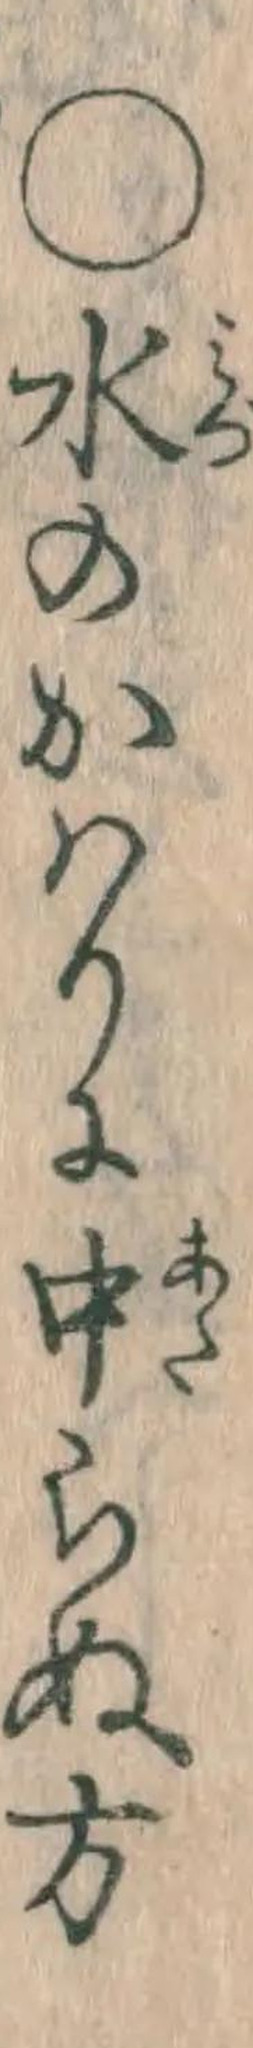○水のかはりに中らぬ方
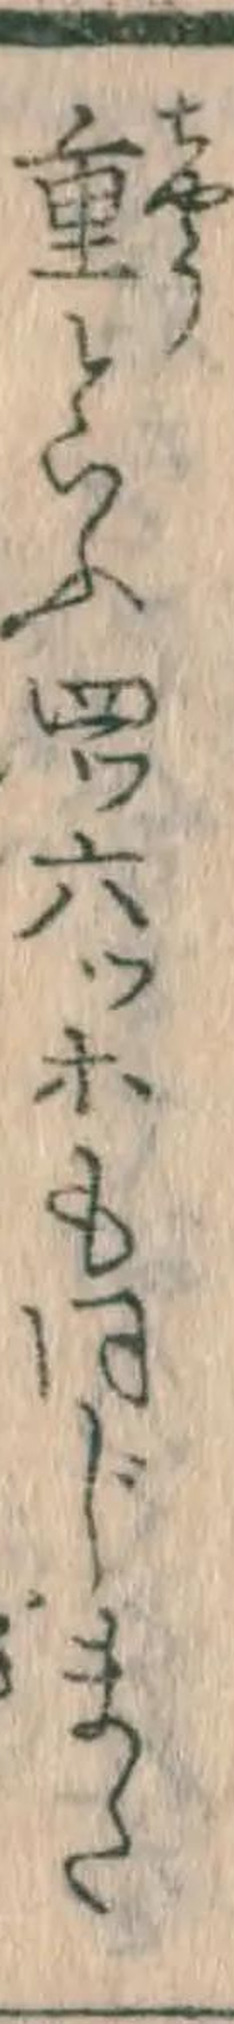重といふ四ッ六ッ等も同じまた
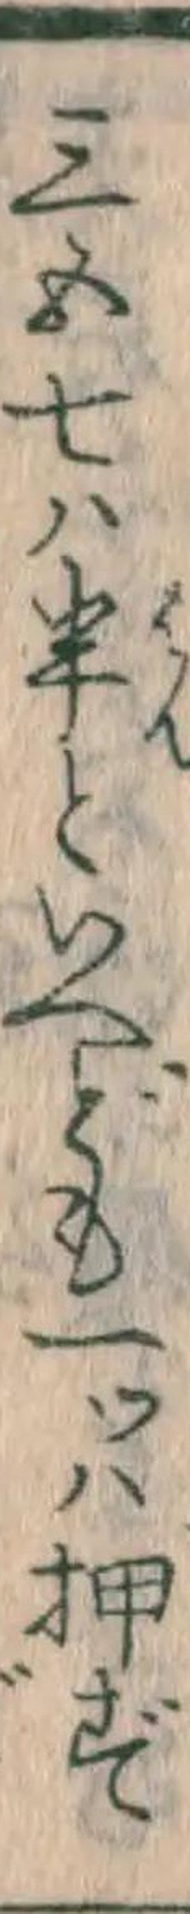三五七は半といへども一ッは押ず
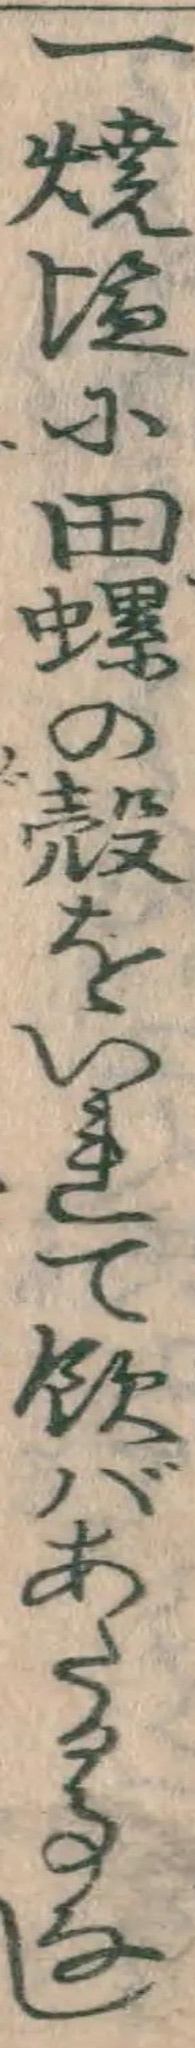一焼塩に田螺の殻をいれて飲ばあたる事なし
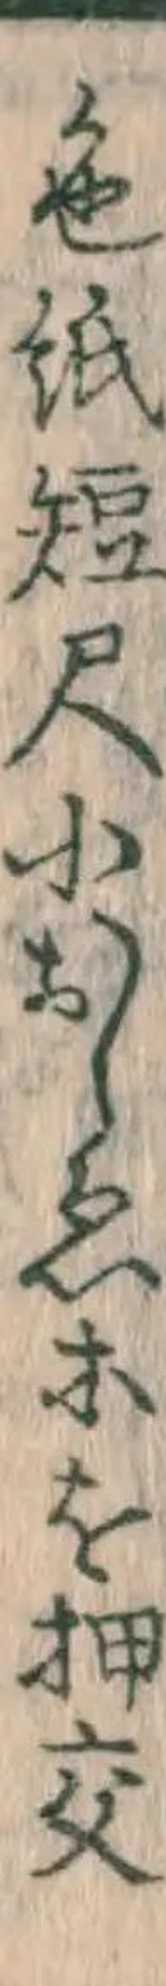色紙短尺におしゑ等を押交
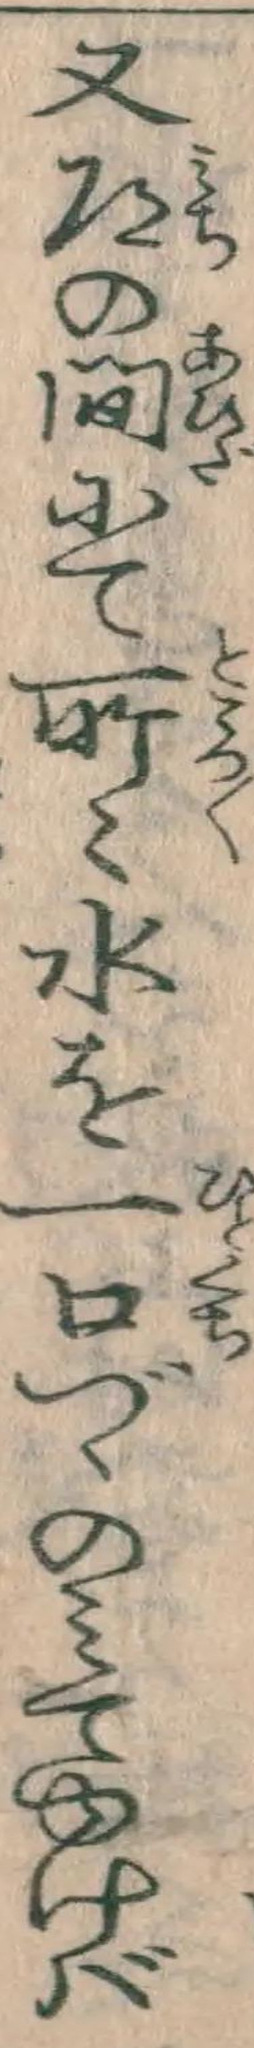又道の間にて所々水を一口づゝのみてゆけば
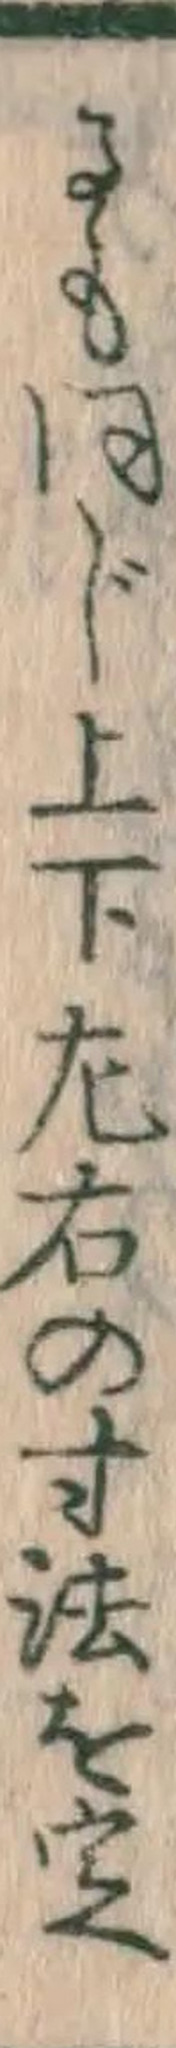るも同じ上下左右の寸法を定
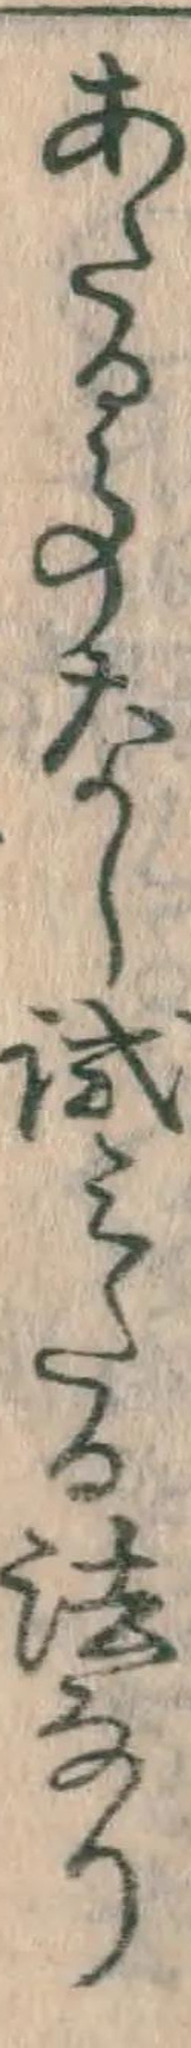あたる事なし試みたる法なり
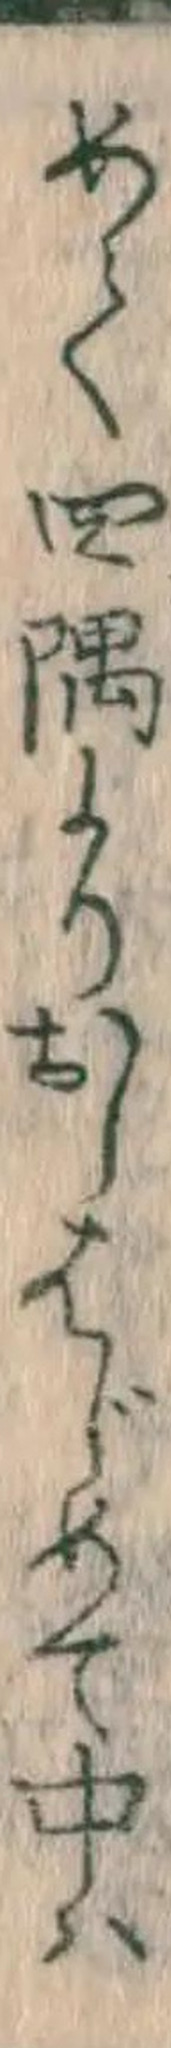めて四隅よりおしはじめて中は
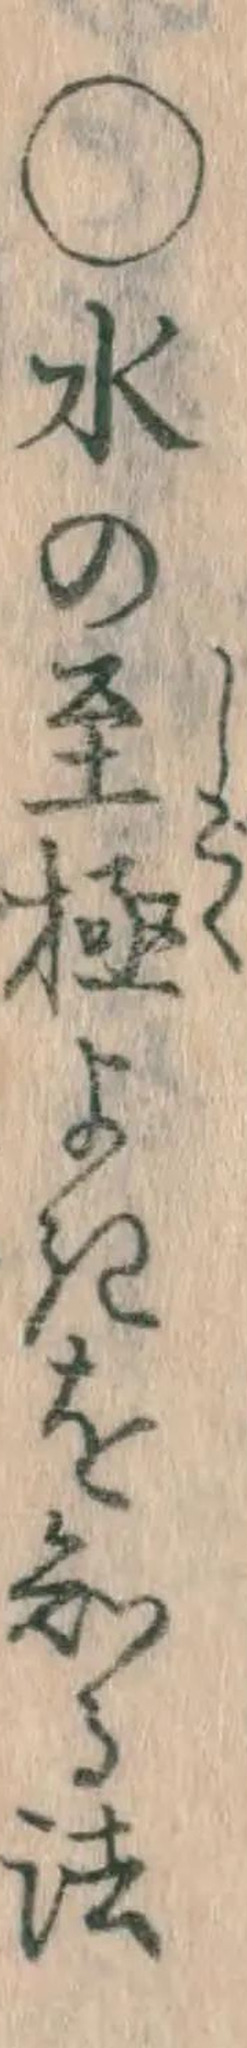○水の至極よきを知る法
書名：広益秘事大全 3巻. [2]
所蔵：国立国会図書館 National Diet Library, JAPAN
